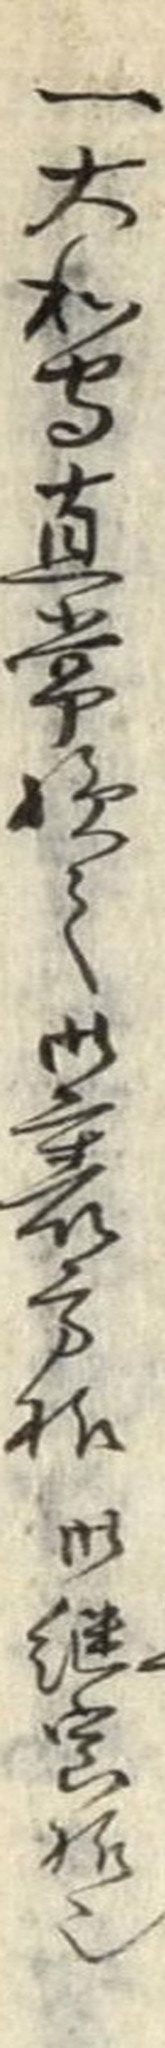一大和守直常様之御裏方様御継室様也
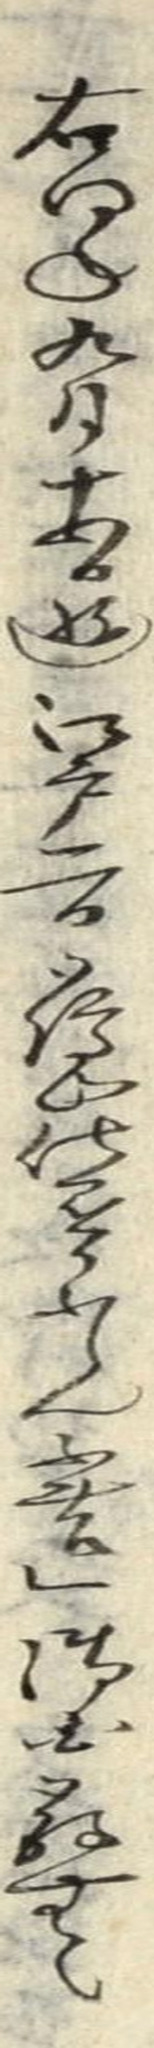右同年九月十五日逝江戸二日御停止仕懸りふしん不苦」御国御触無之
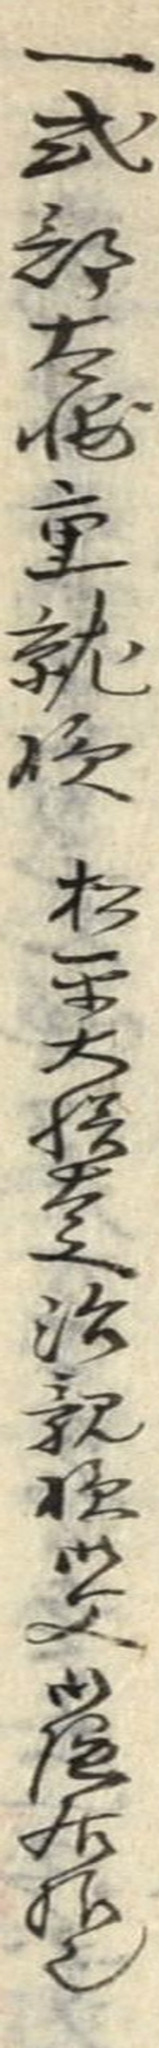一式部太輔重就様松平大膳大夫治親様御父御隠居様也

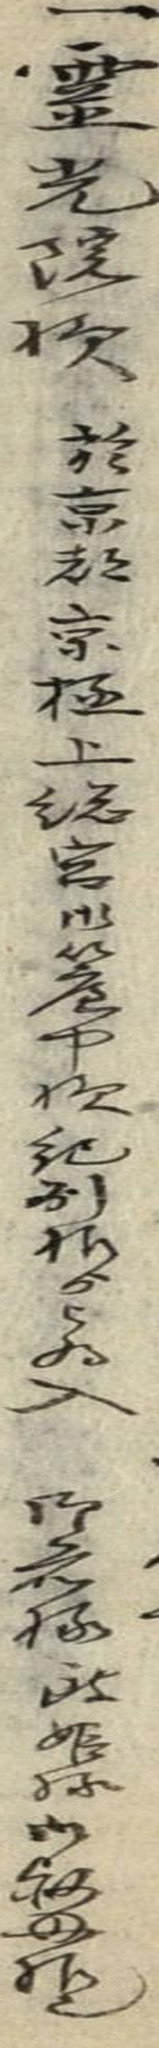一霊光院様於京都京極上総宮御簾中様紀州様ゟ被為入御前様致姫様御叔母様也
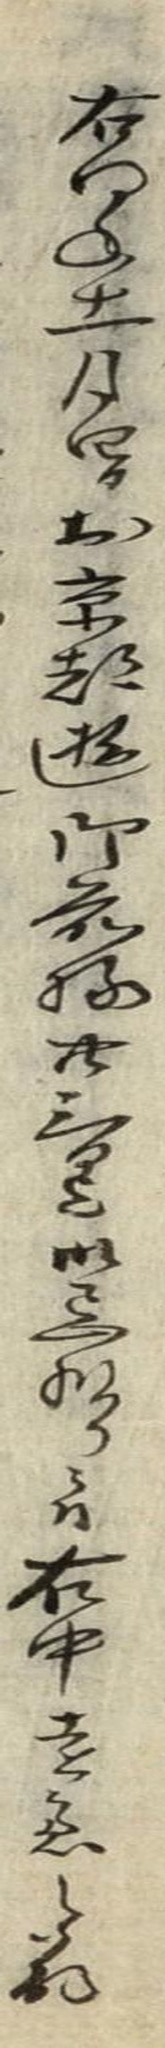右同年十一月四日於京都逝御前様廿三日迄御忌掛りに付右中遠慮之御触
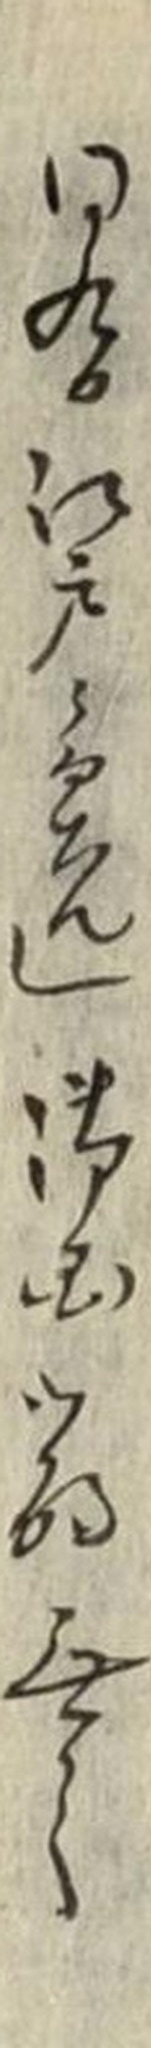同九日江戸にて出ル」御国御触無之
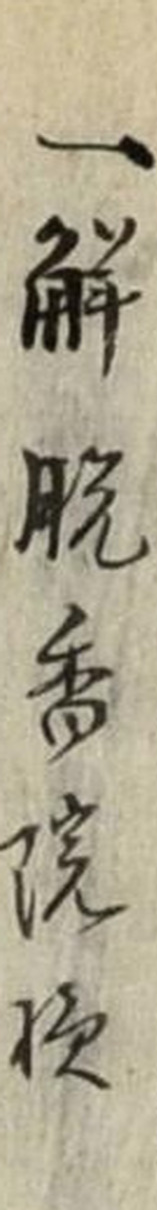一解脱香院様
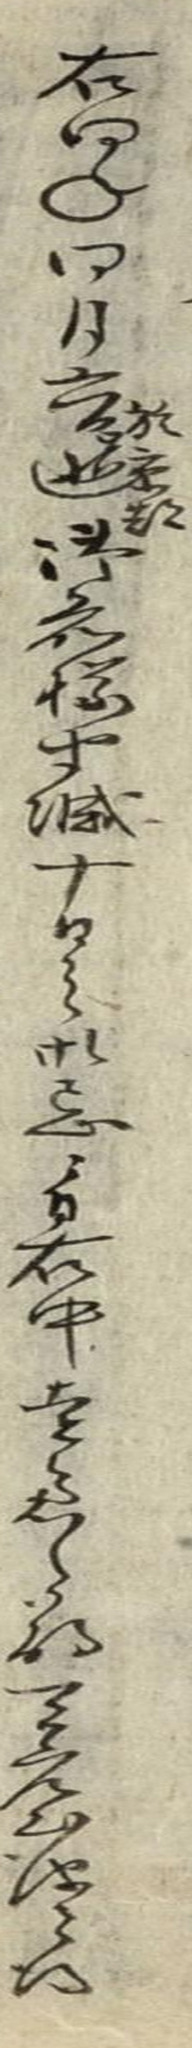右同年同月六日◦逝於京都御前様半減十日之御忌に付右中遠慮之御触可差出儀に候得
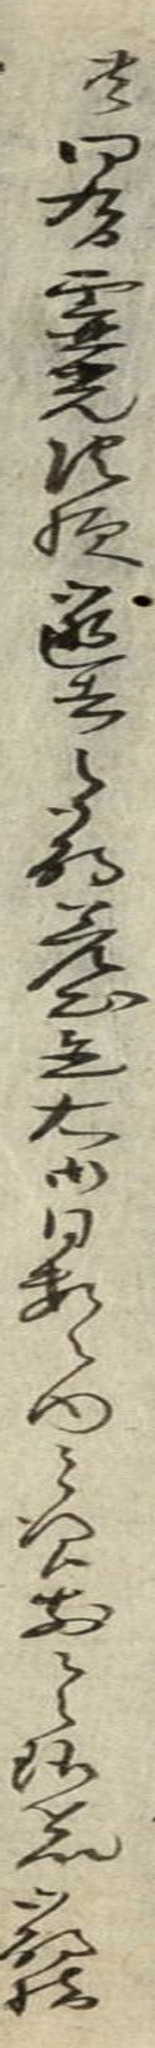共同九日霊光院様御逝去之御触差出置右御日数之内に候得は前々之趣を以御触指
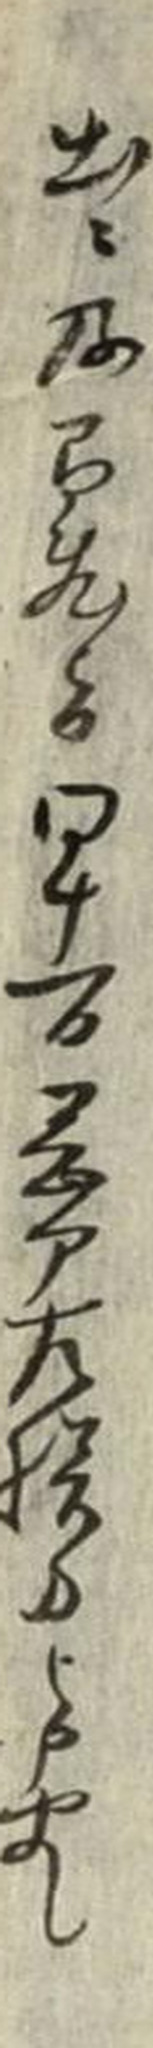出に及間敷旨同十一日岡部左膳方被申聞候
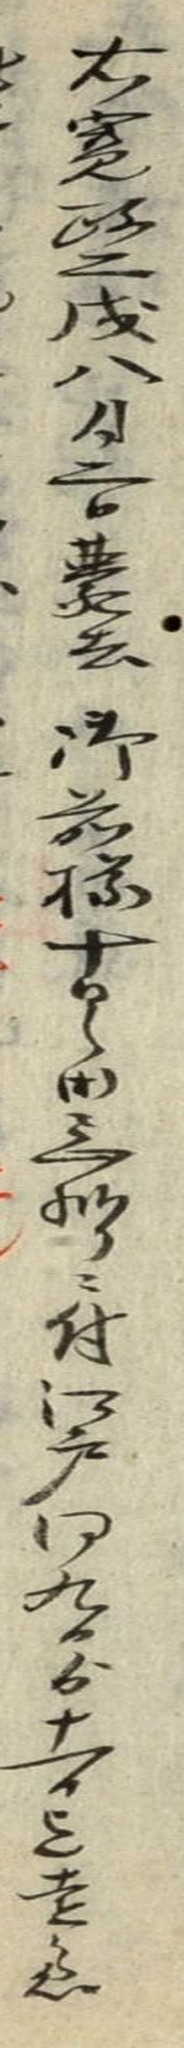右寛政二戌八月二日薨去御前様十日之御忌掛りに付江戸同九日ゟ十一日迄遠慮
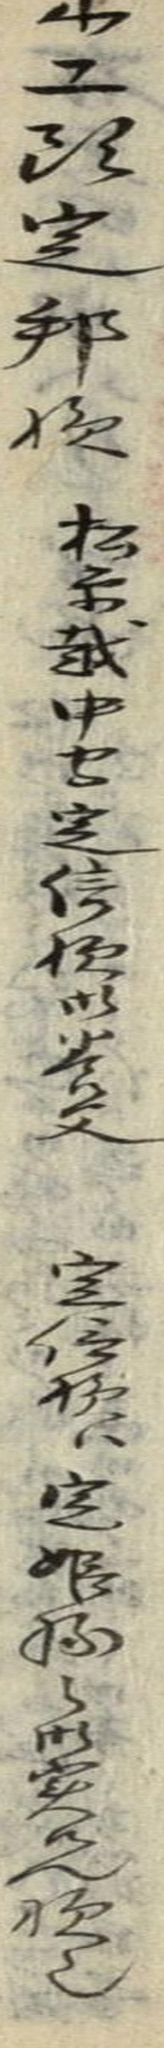一木工頭定邦様松平越中守定信様御養父定信様は定姫様之御実兄様也
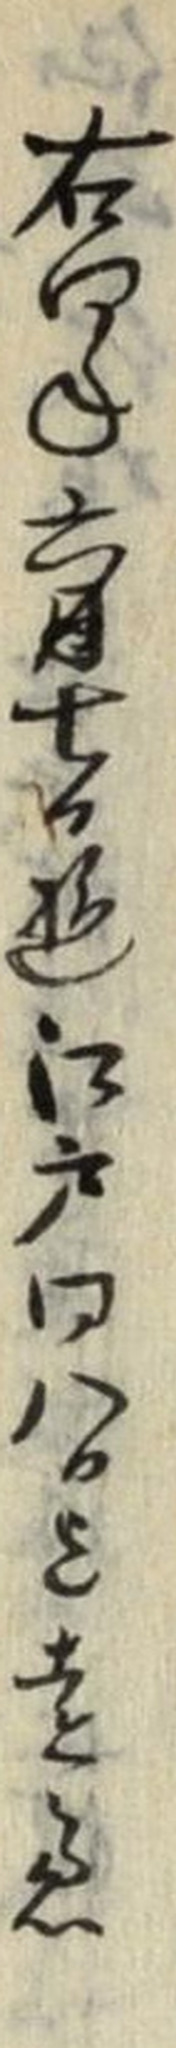右同年六月七日逝江戸同八日迄遠慮
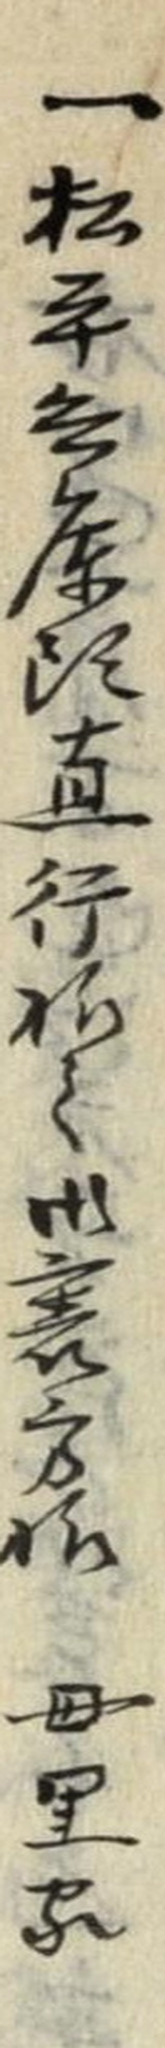一松平兵庫頭直行様之御裏方様母里家
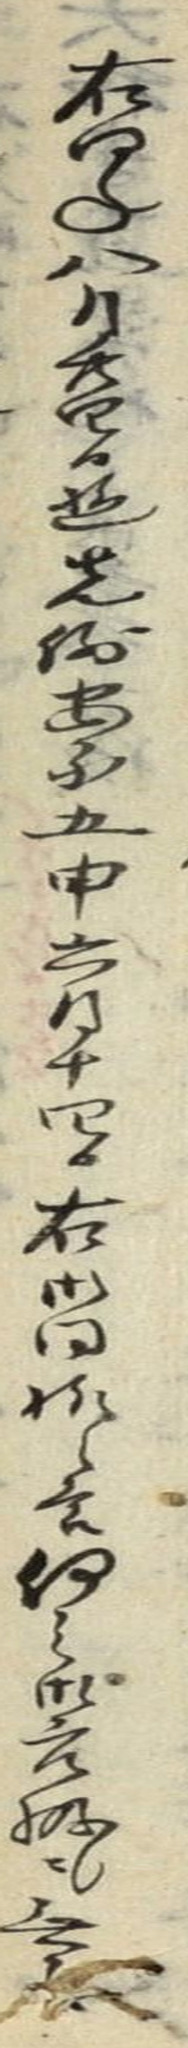右同年八月廿四日逝先例安永五申六月十四日右御同様之節何之御取扱も無之
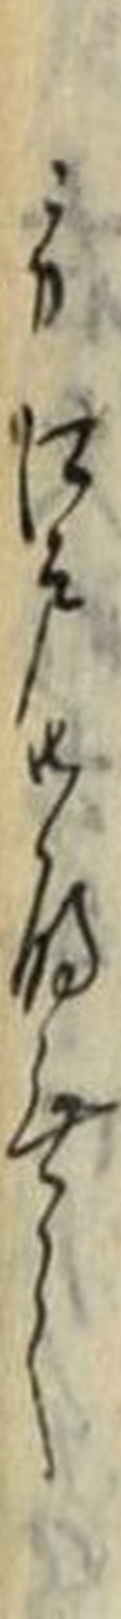に付江戸御触無之
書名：御停止異変死失
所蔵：福井県文書館 Fukui Prefectural Archives
